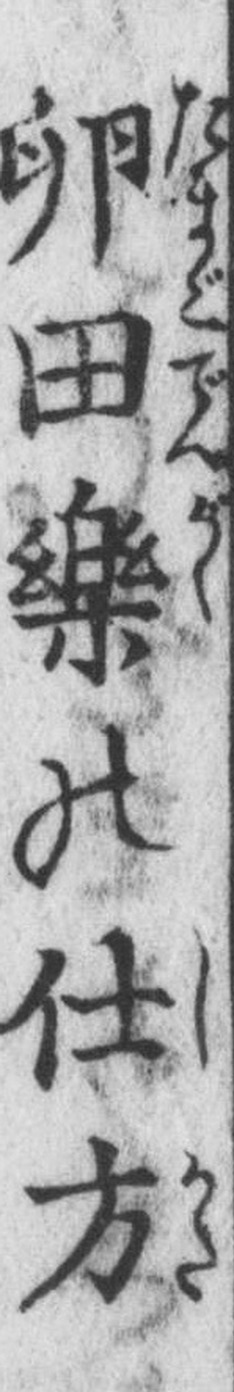卵田楽の仕方
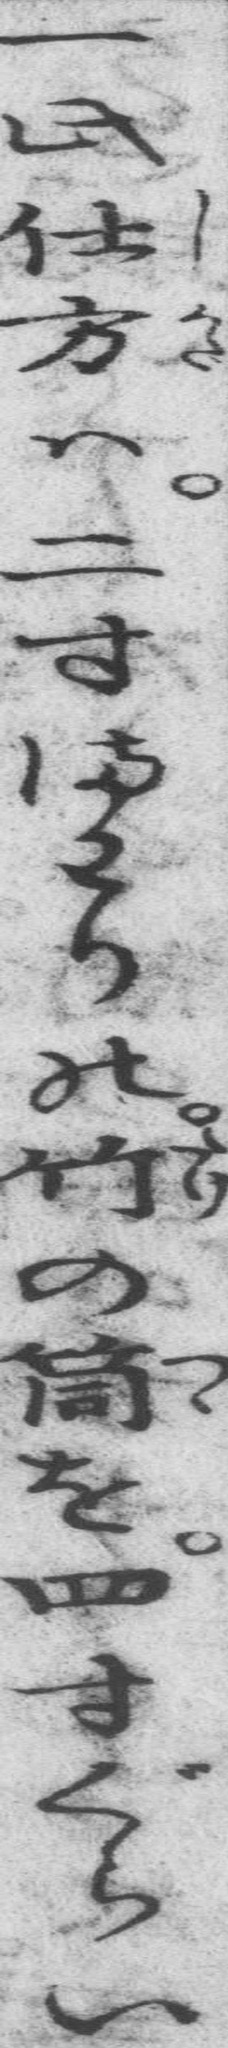一此仕方は。二寸まわりの。竹の筒を。四寸ぐらい
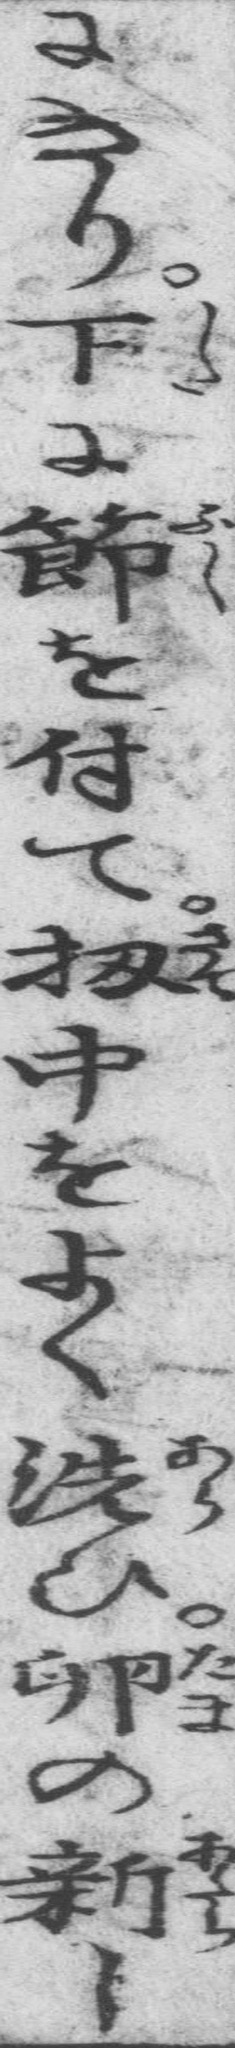にきり。下に節を付て。扨中をよく洗ひ。卵の新し
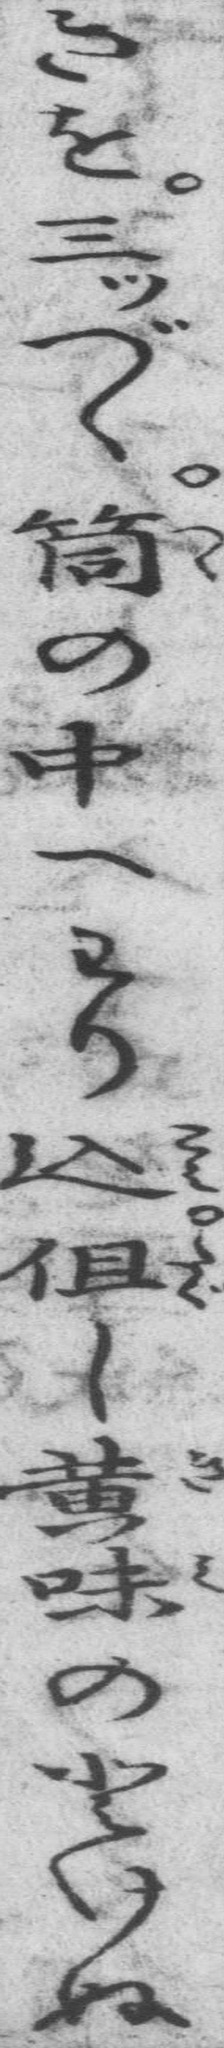きを。三ツづゝ。筒の中へわり込。但し黄味のとけぬ

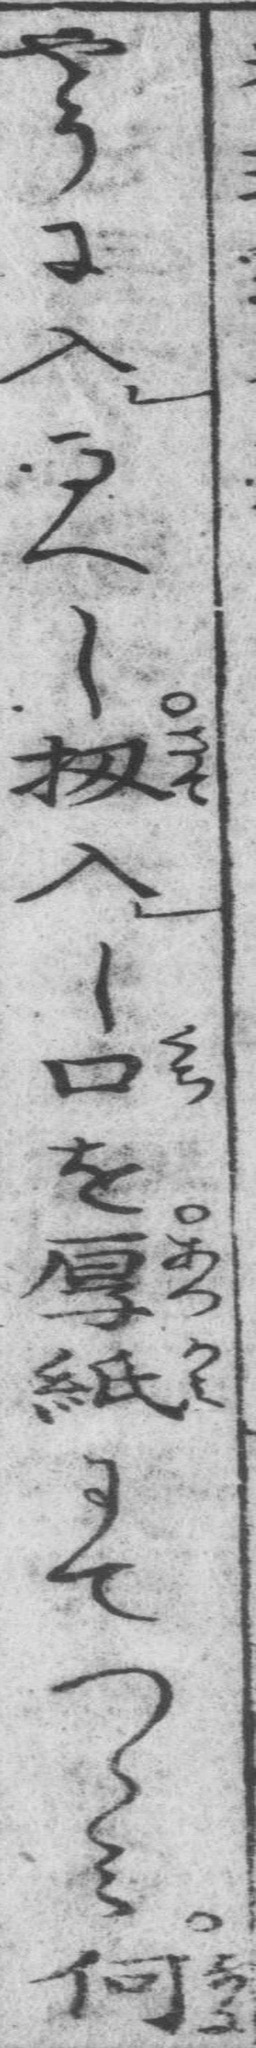やうに入れるへし。扨入れし口を。厚紙にてつゝみ。何
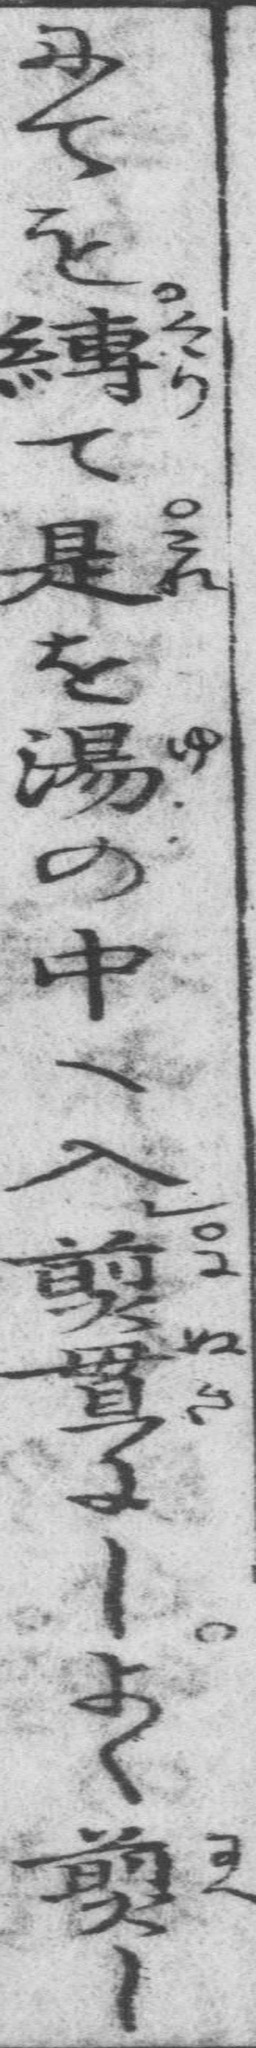にても。縛て。是を湯の中へ入れ。煎貫にし。よく煎し
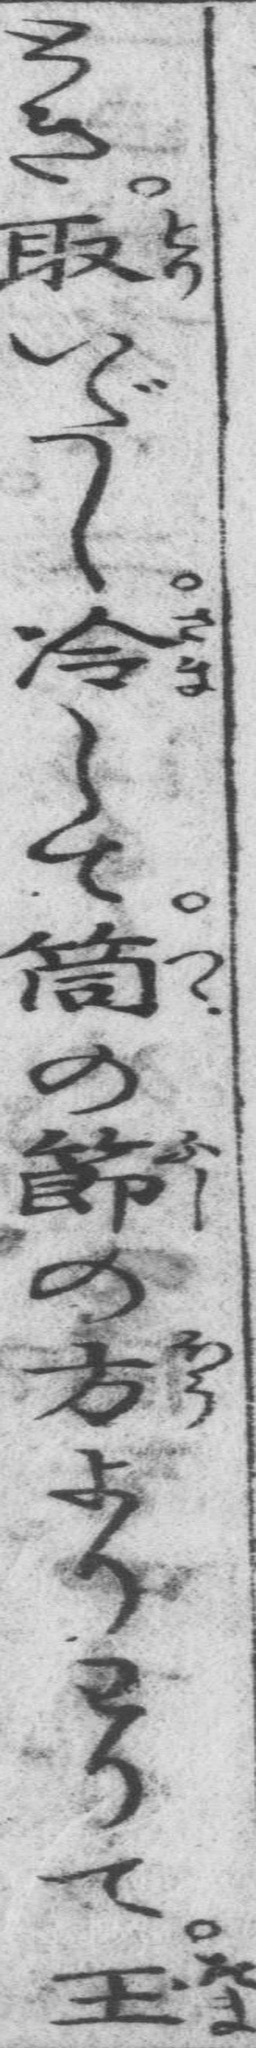とき。取いだし。冷して。筒の節の方よりわりて。玉
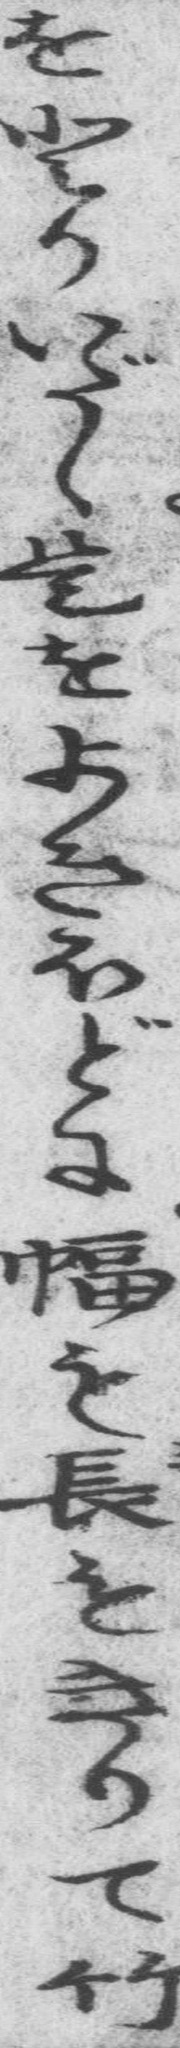をとりいだし。是をよきほどに。幅も長もきりて。竹
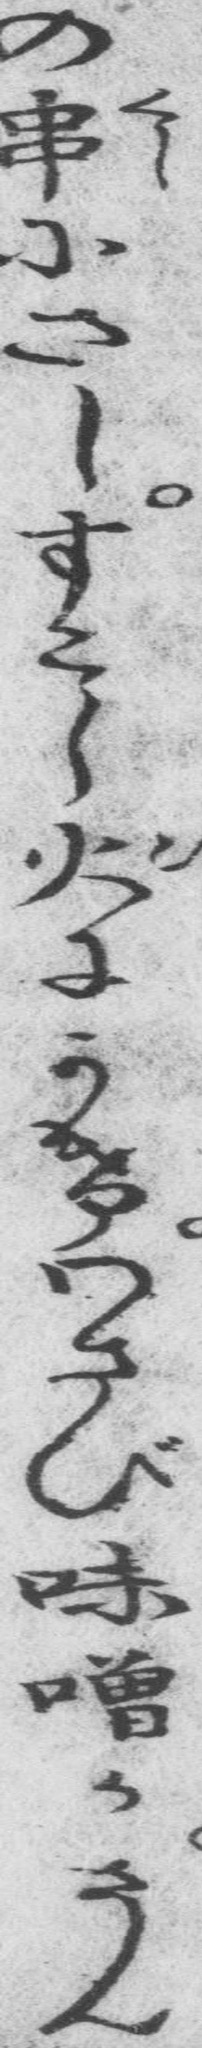の串にさし。すこし火にかけ。わさび味噌か。さん
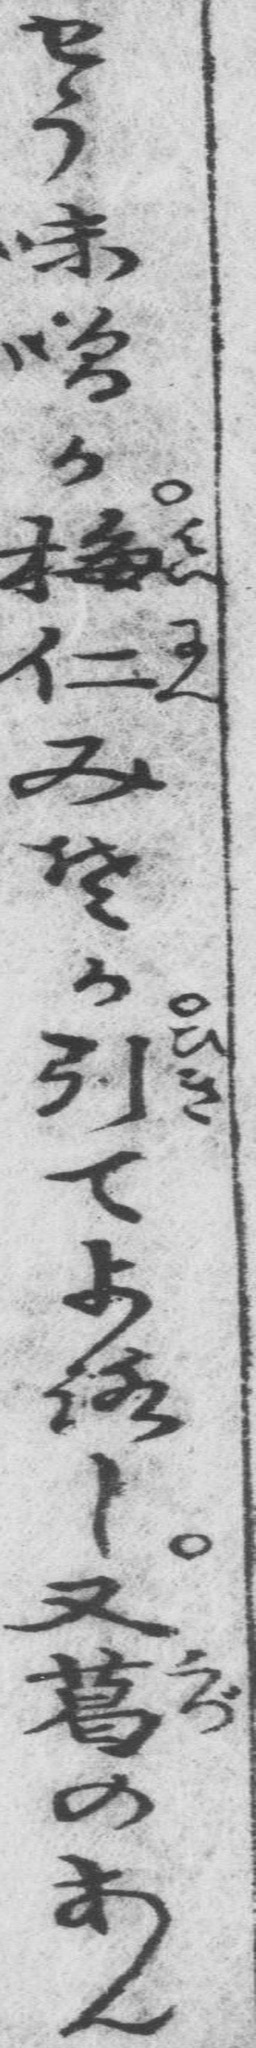せう味噌か。梅仁みそか。引てよろし。又葛のあん
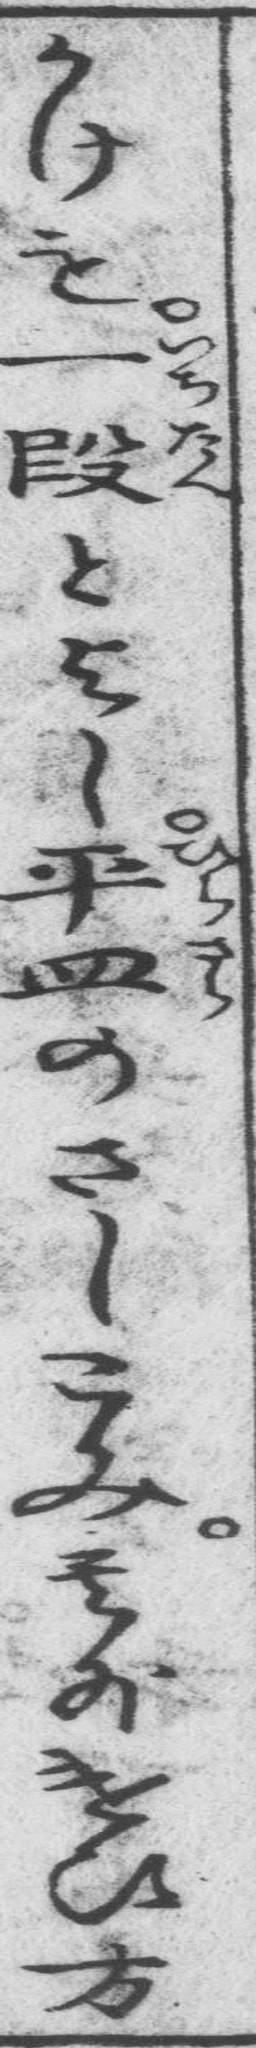かけも。一段とよし。平皿のさしこみ。其外遣ひ方
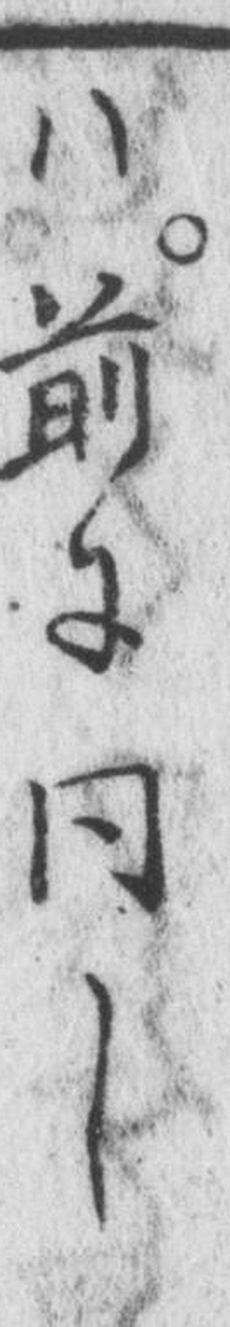は。前に同し
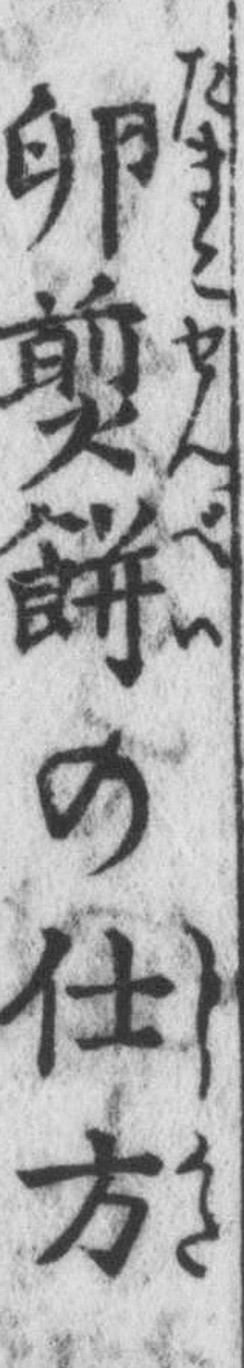卵煎餅の仕方
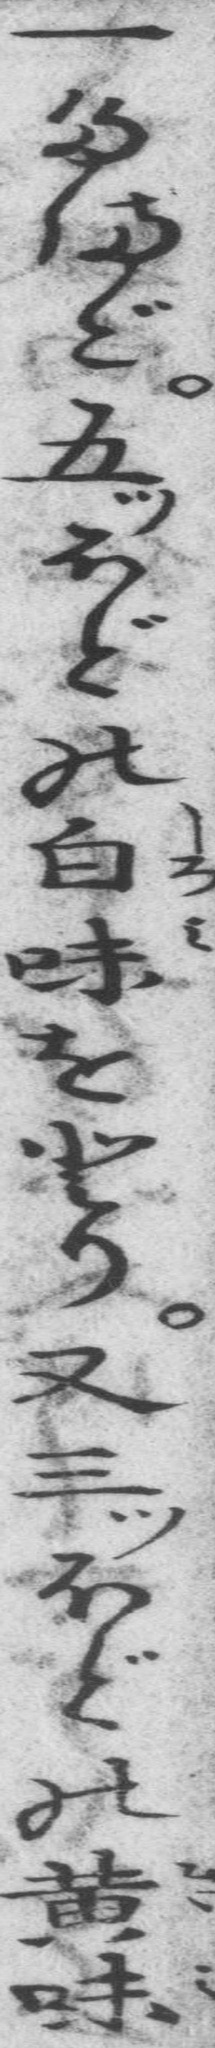一たまご。五ツほどの白味をとり。又三ツほどの黄味
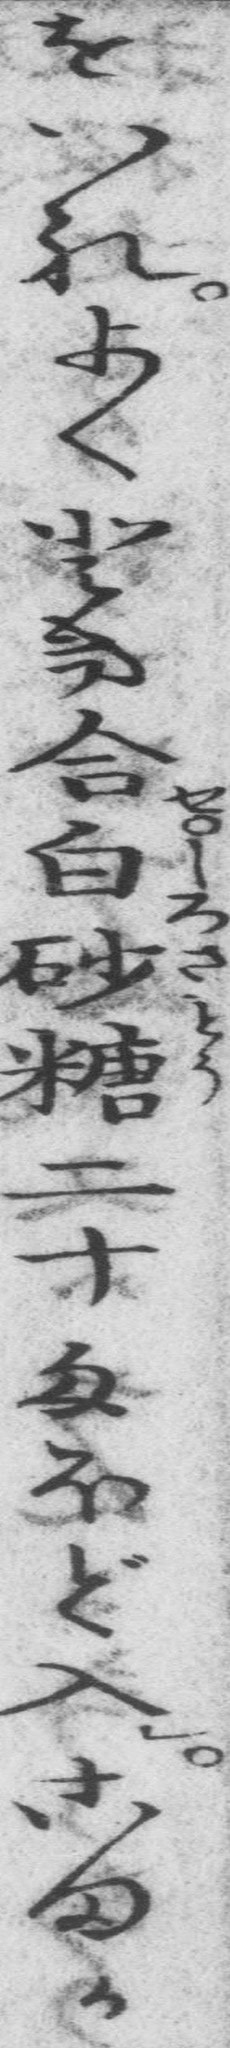をいれ。よくとき合せ。白砂糖二十匁ほど入れ。こまか
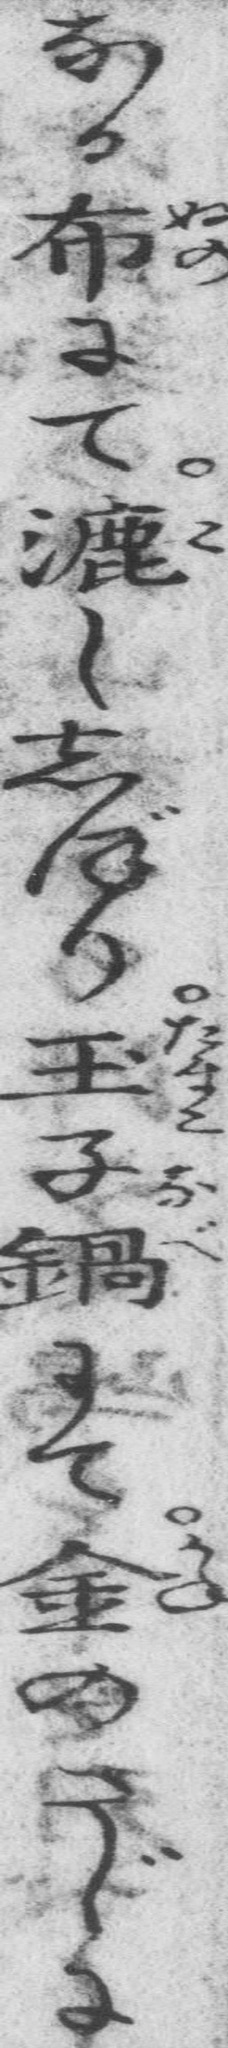なる布にて。漉ししぼり。玉子鍋にて。金のさじに
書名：萬寳料理秘密箱
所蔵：大阪府立大学学術情報センター 国文学研究資料館
